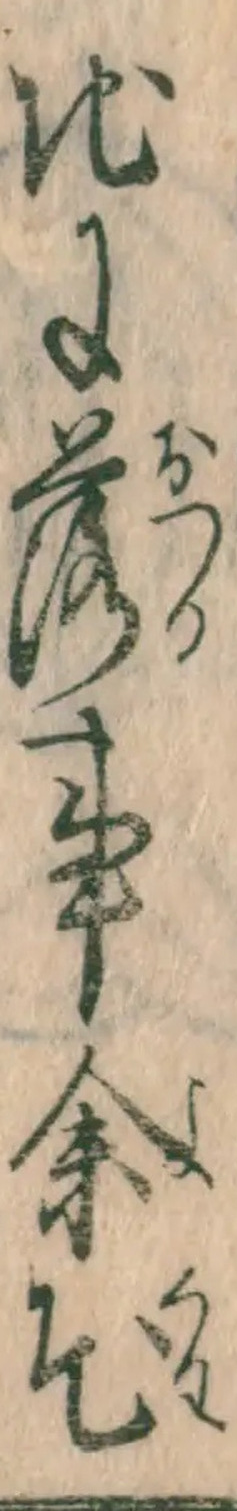地に落事余花
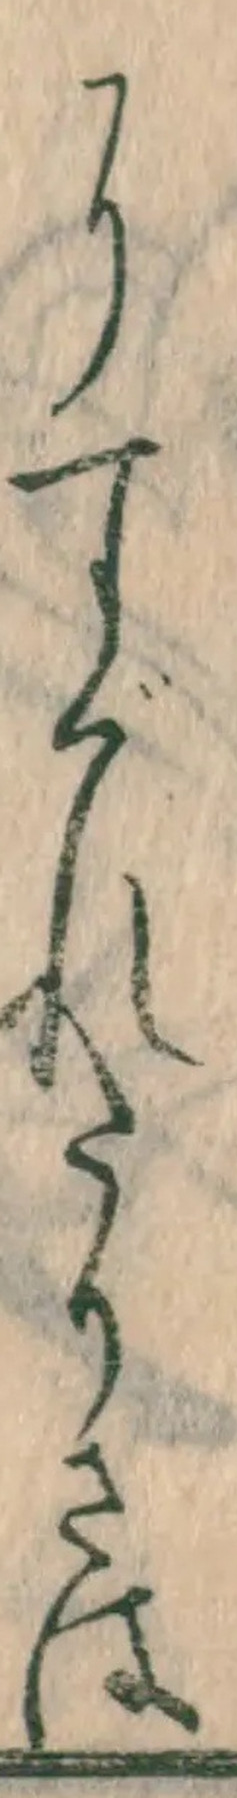にすぐれたりさは
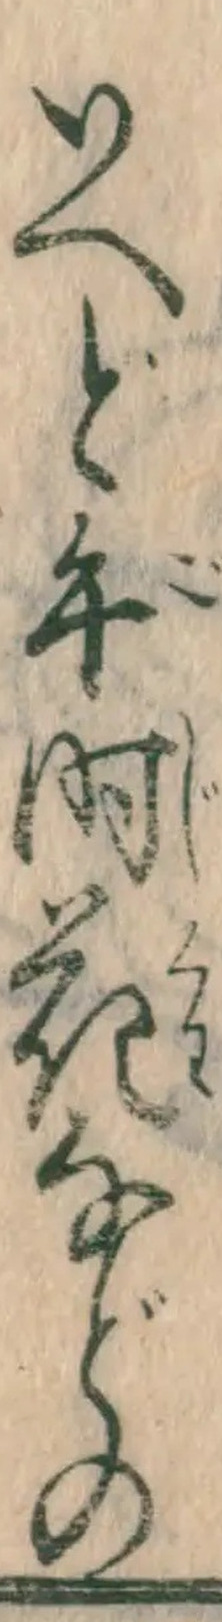いへど午時花などの
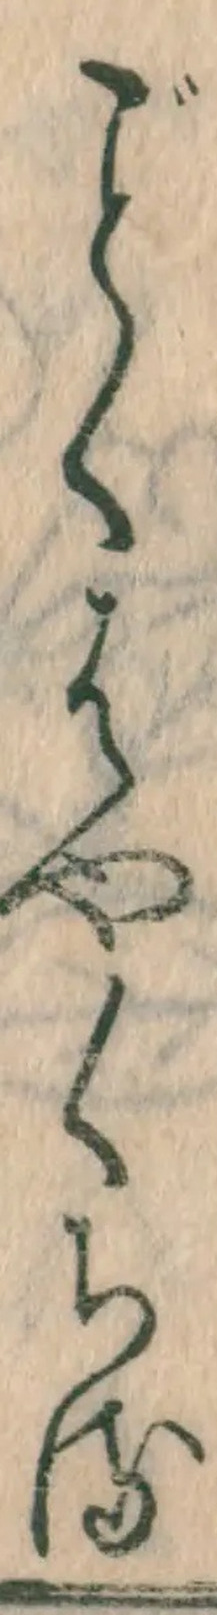ごとくはやくちる
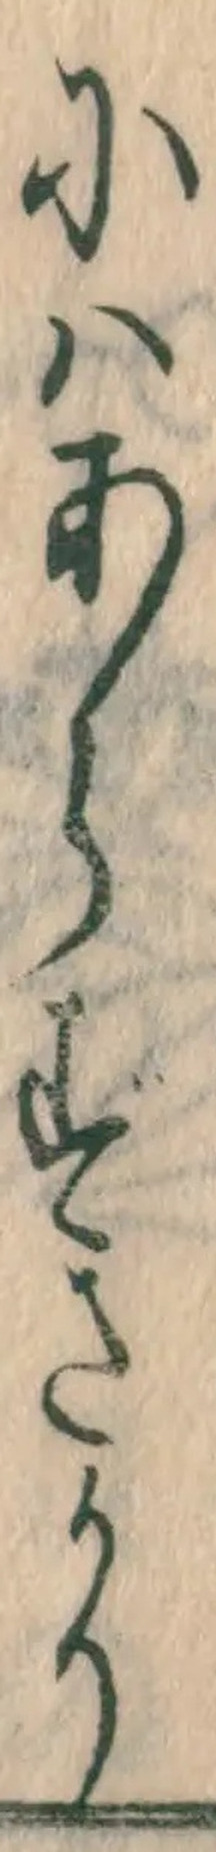にはあらずさらり
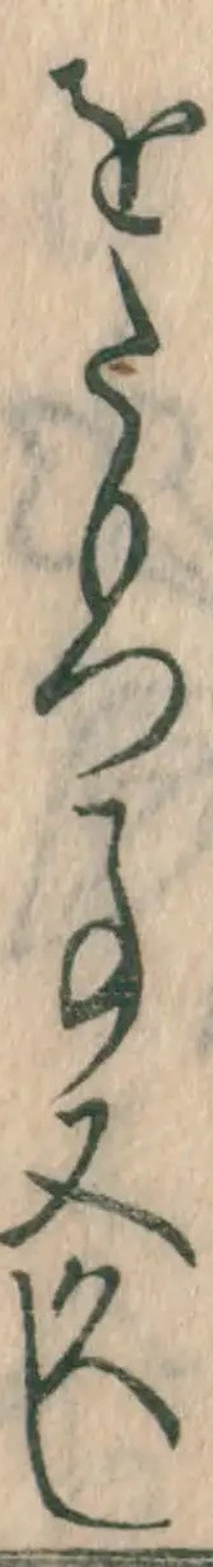をたもつ事又久し

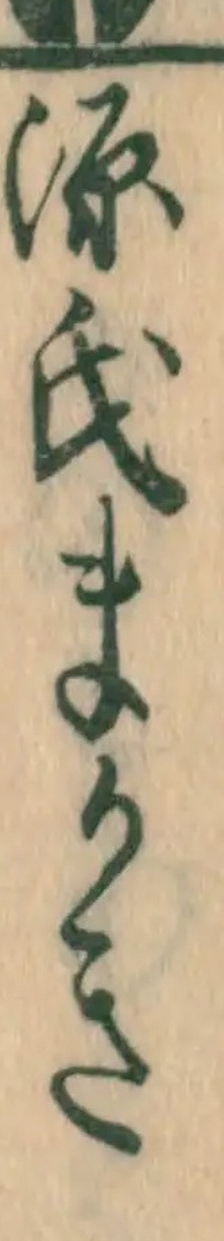源氏まかき
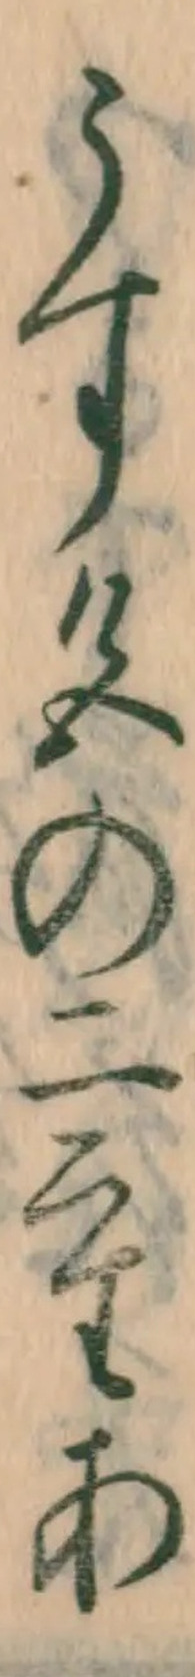うす色の二重あ
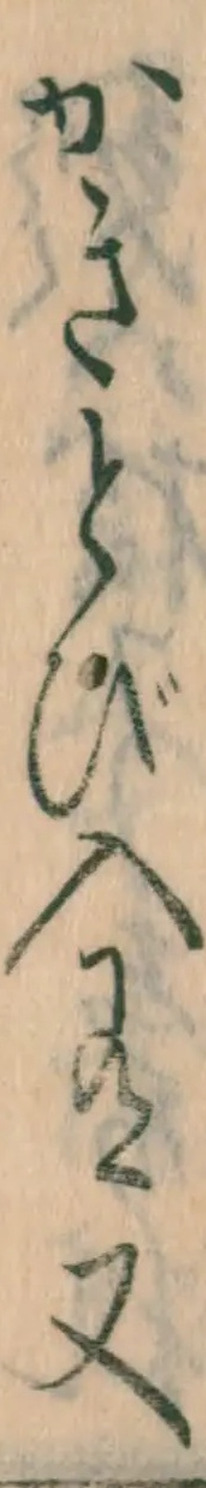かきとび入有又
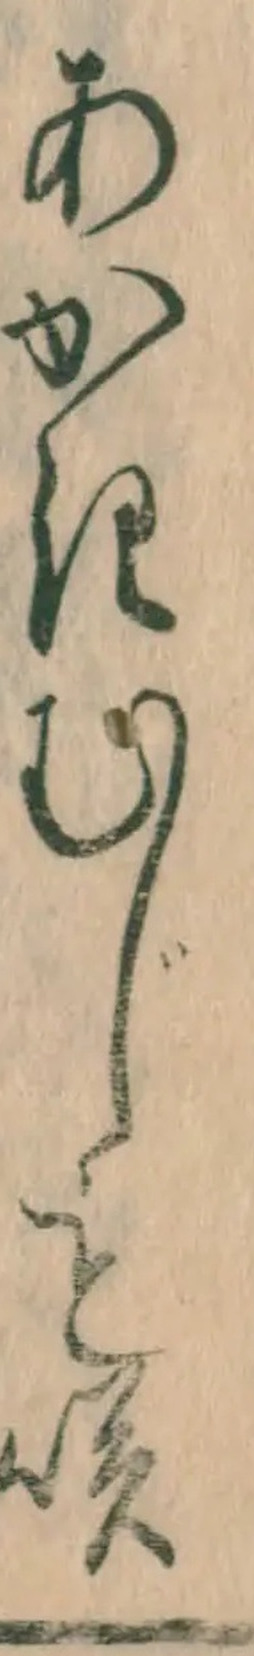あかきむじも咲
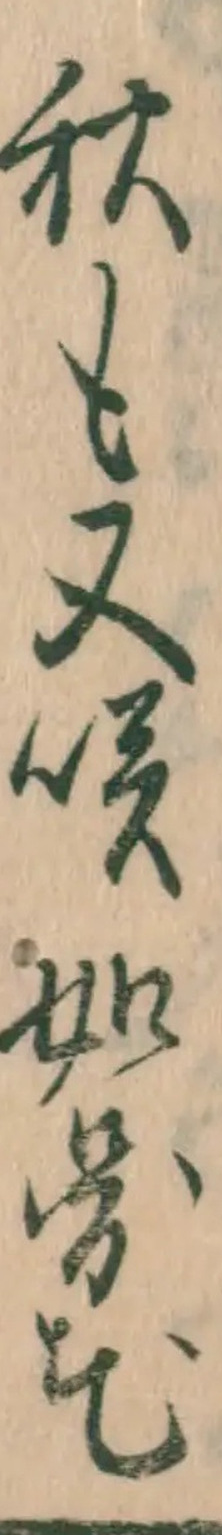秋も又咲如図花
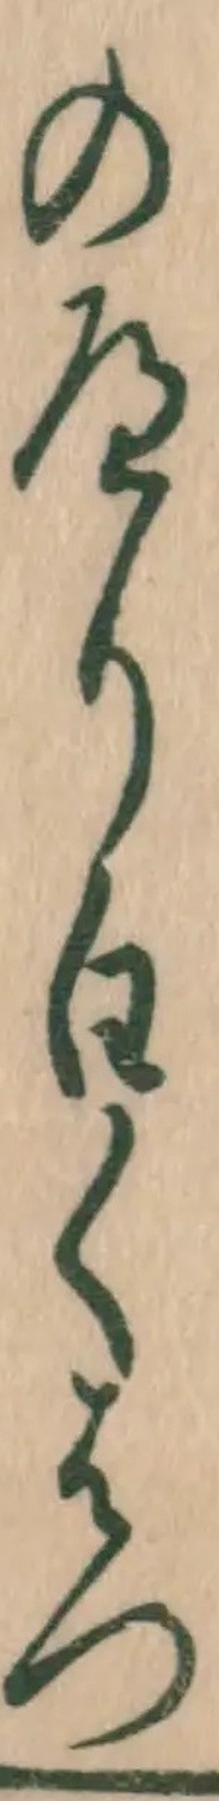のへり白くはつ
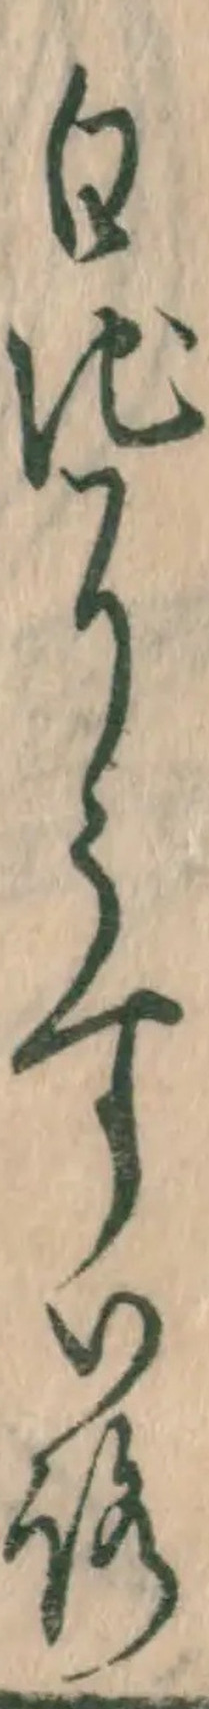白地にうすいろ
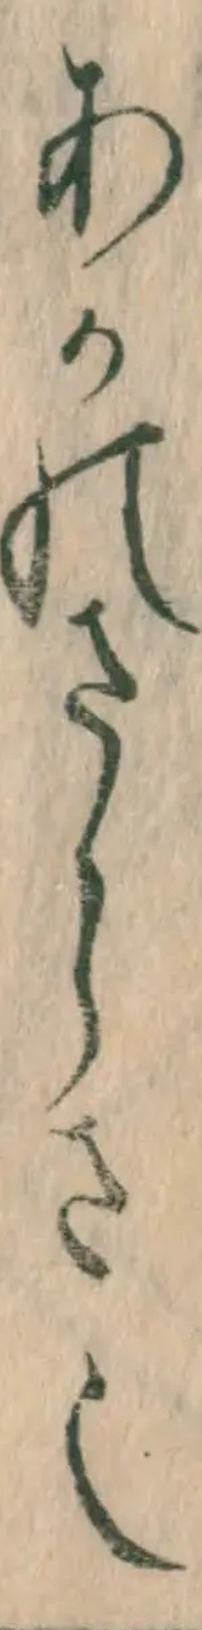あかのさらさ也
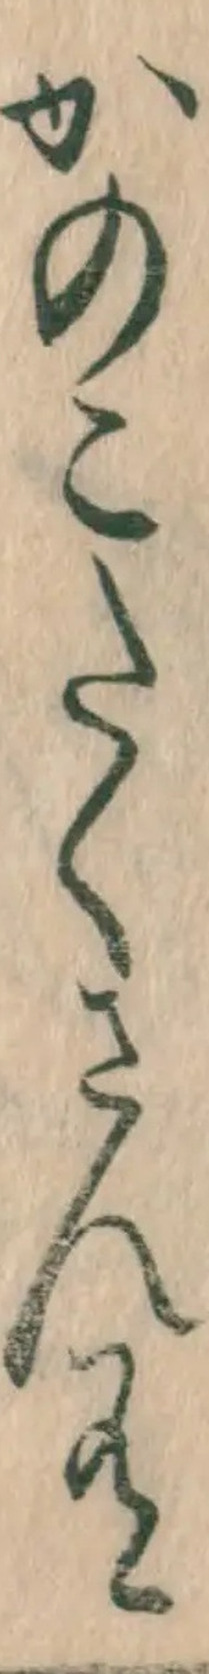かのこたくさん有
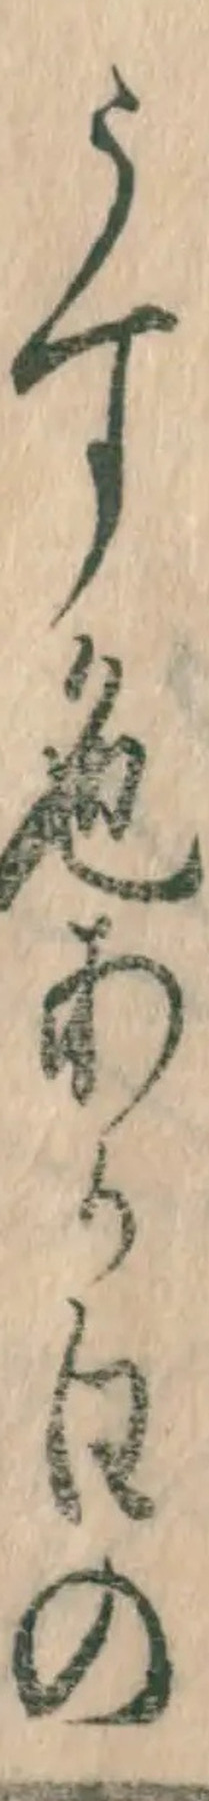うす色あか白の
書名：錦繍枕 5巻. [4]
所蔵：国立国会図書館 National Diet Library, JAPAN
